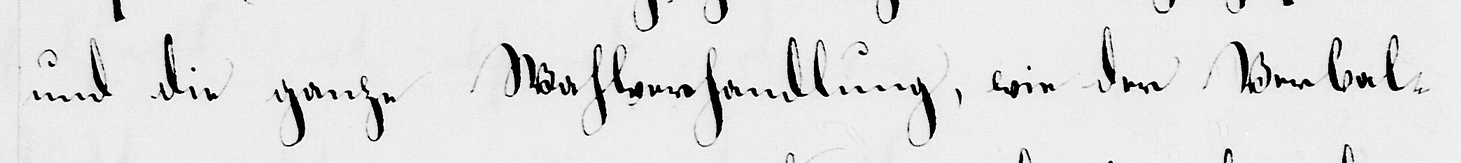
und die ganze Wahlverhandlung, wie der Verbal¬
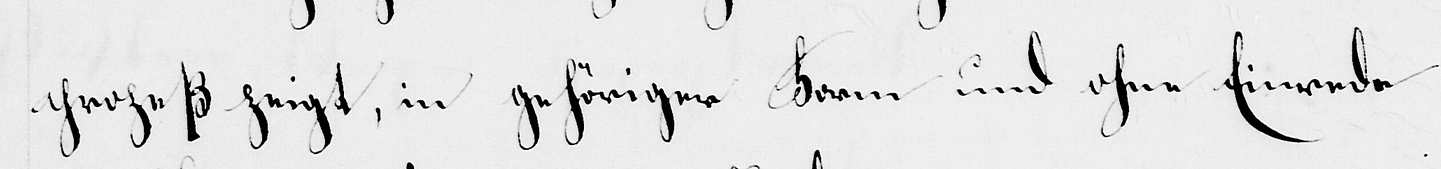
prozeß zeigt, in gehöriger Form und ohne Einrede
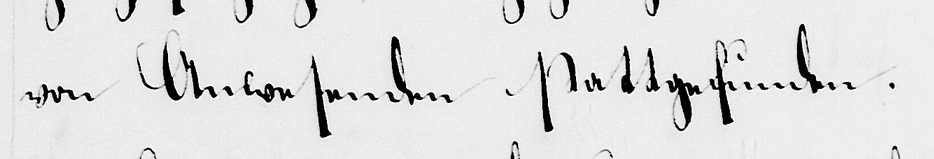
von Anwesenden stattgefunden.
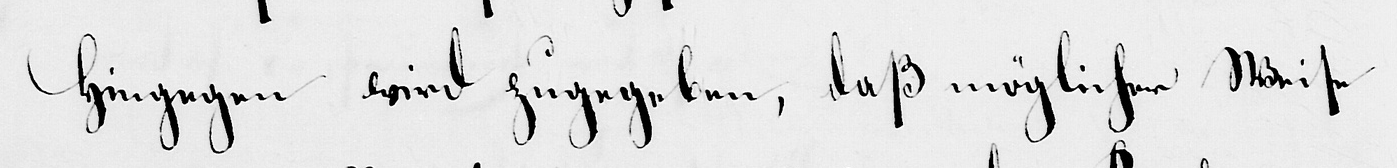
Hingegen wird zugegeben, daß möglicher Weise
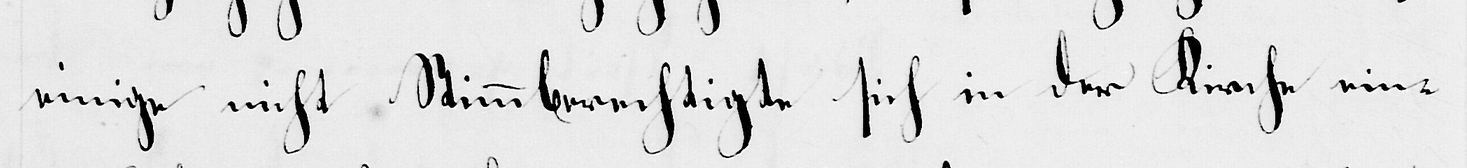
einige nicht Stimmberechtigte sich in der Kirche ein¬
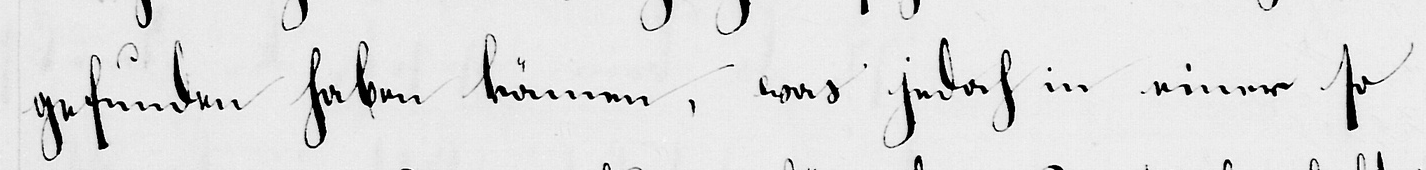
gefunden haben können, was jedoch in einer so
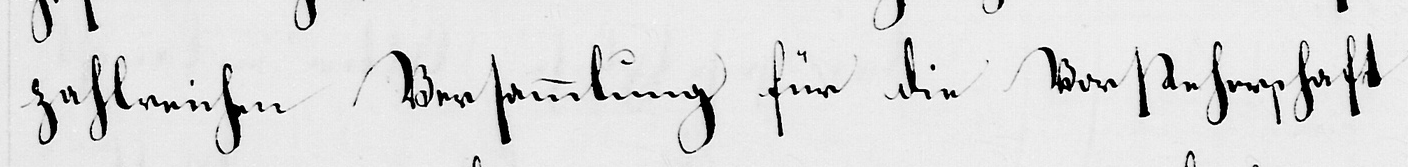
zahlreichen Versammlung für die Vorsteherschaft
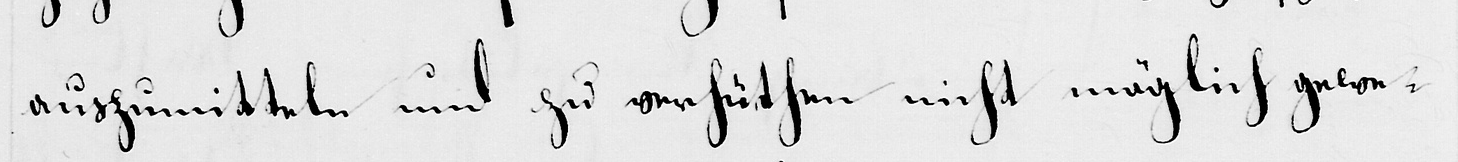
auszumitteln und zu verhüthen nicht möglich gewe¬
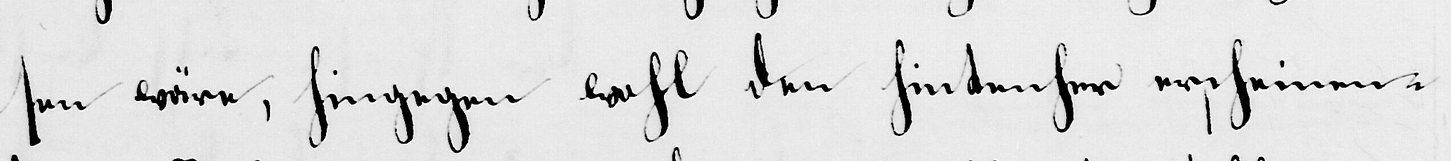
sen wäre, hingegen wohl den hintenher erscheinen¬
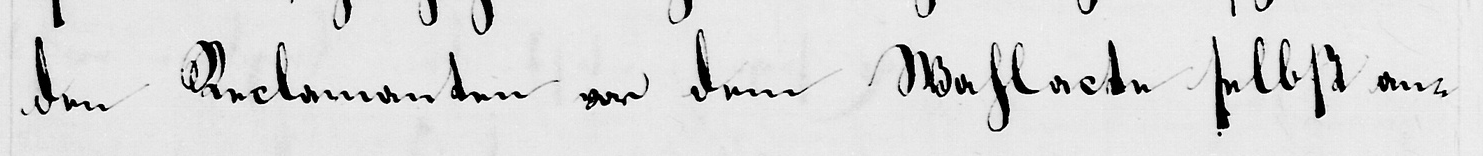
den Reclamanten vor dem Wahlacte selbst an-
